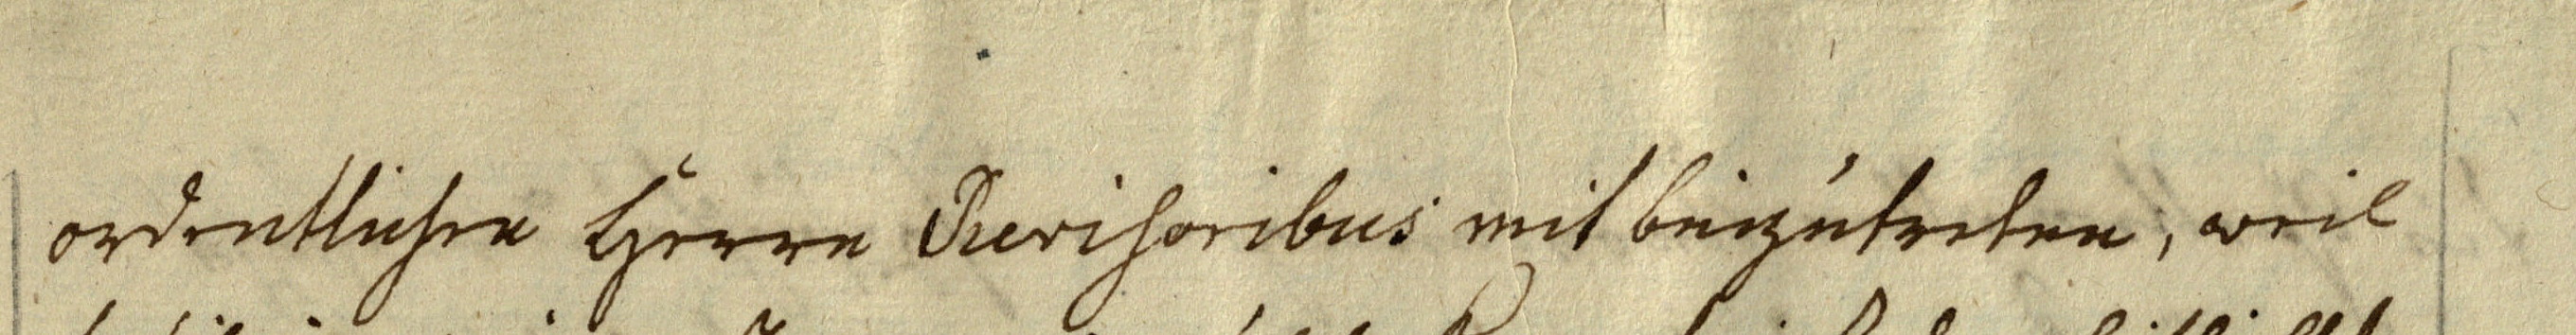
ordentlichen Herrn Revisoribus mit beizutreten, weil
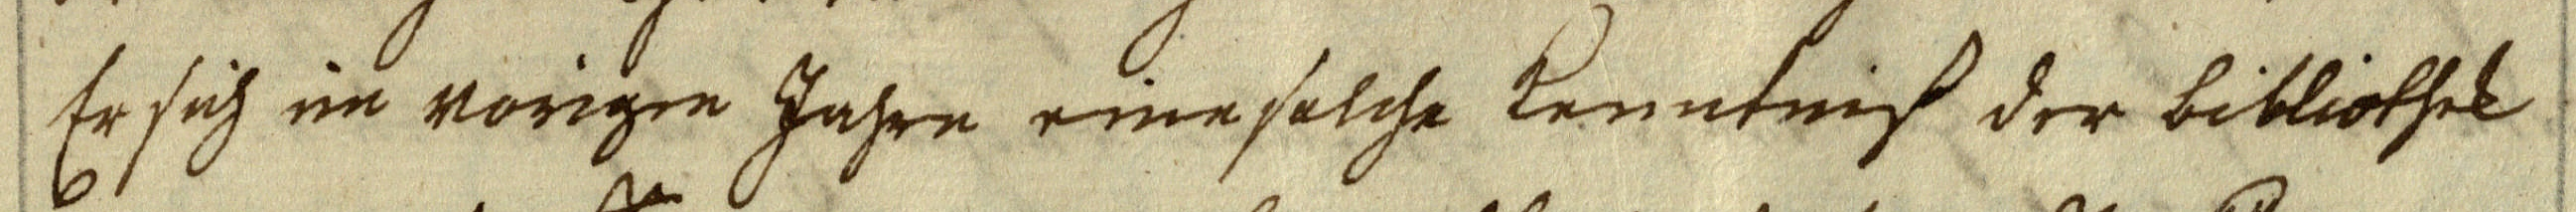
Er sich im vorigen Jahre eine solche Kenntniß der Bibliothek
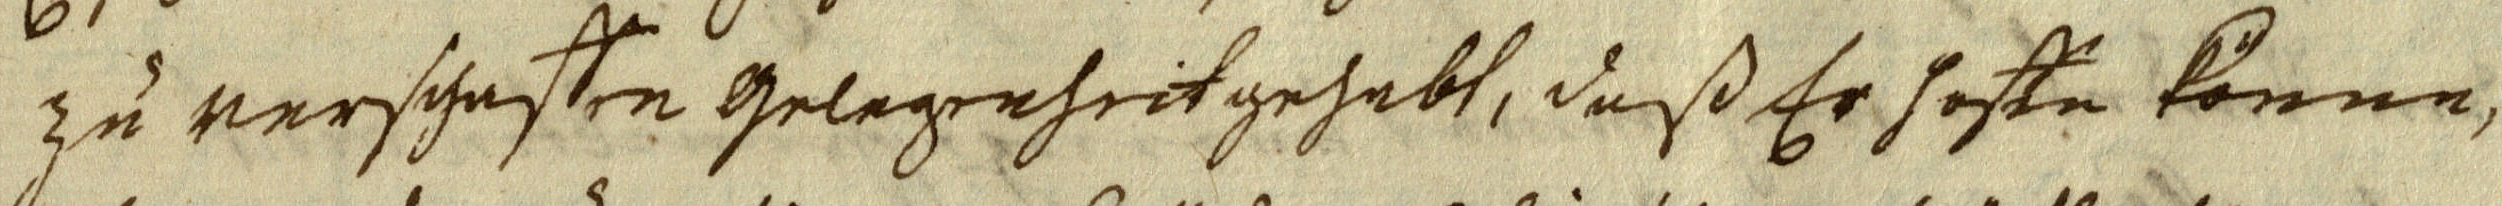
zu verschaffen Gelegenheit gehabt, daß Er hoffen könne,
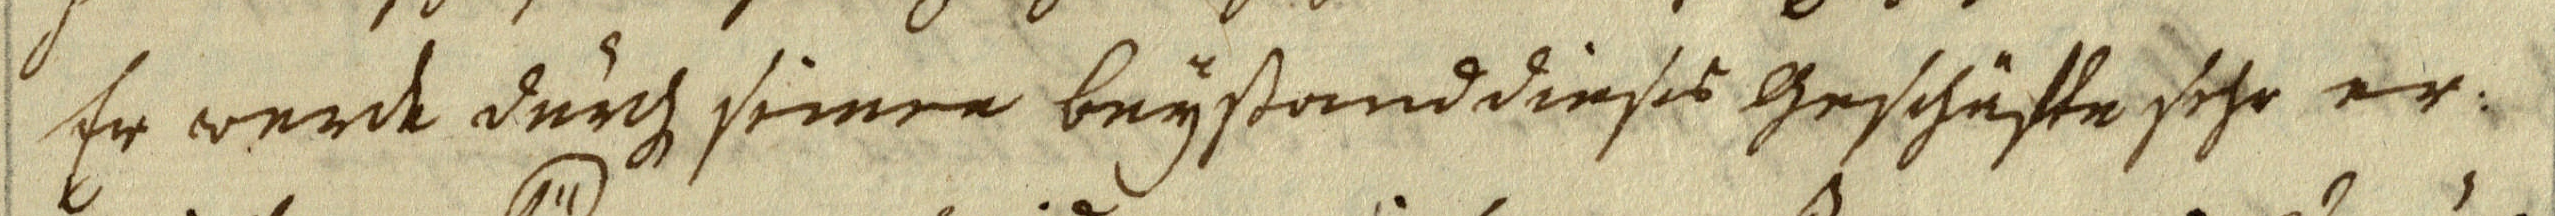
Er werde durch seinen Beÿstand dieses Geschäfte sehr er¬
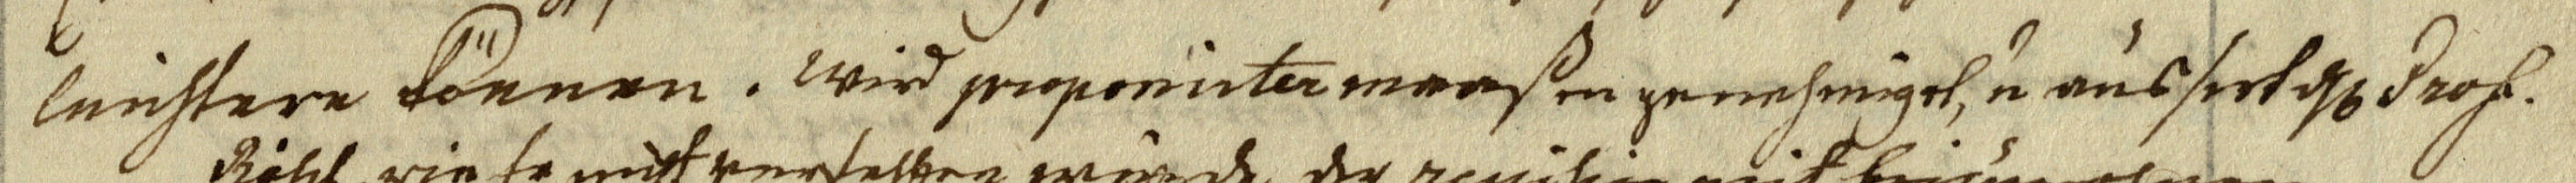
leichtern können. Wird proponirter maaßen genehmiget, u äussert dh Prof.
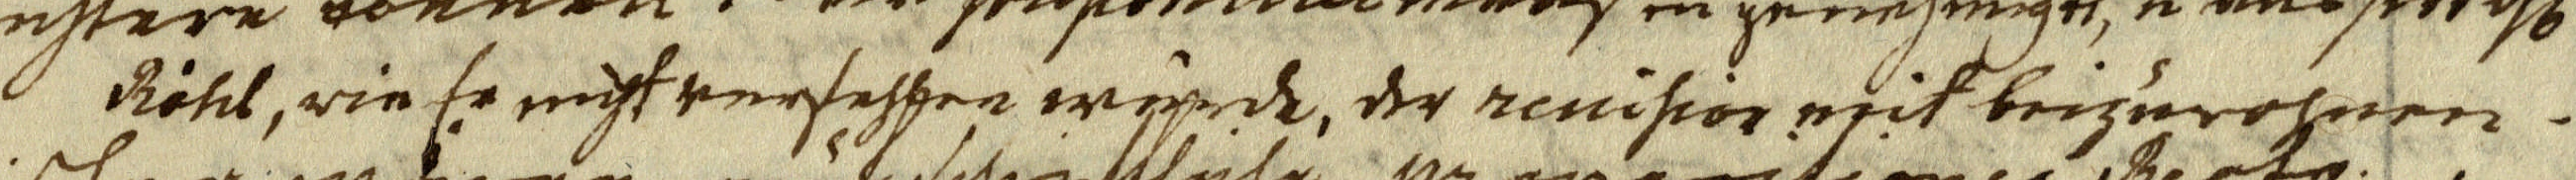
Röhl, wie Er nicht verfehlen würde, der revision mit beizuwohnen
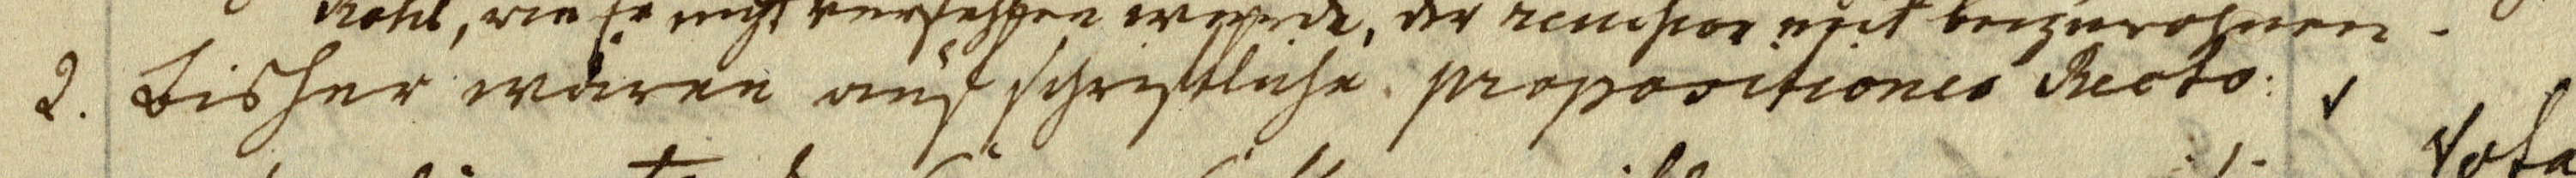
2. Bisher wären auf schriftliche propositiones Recto¬
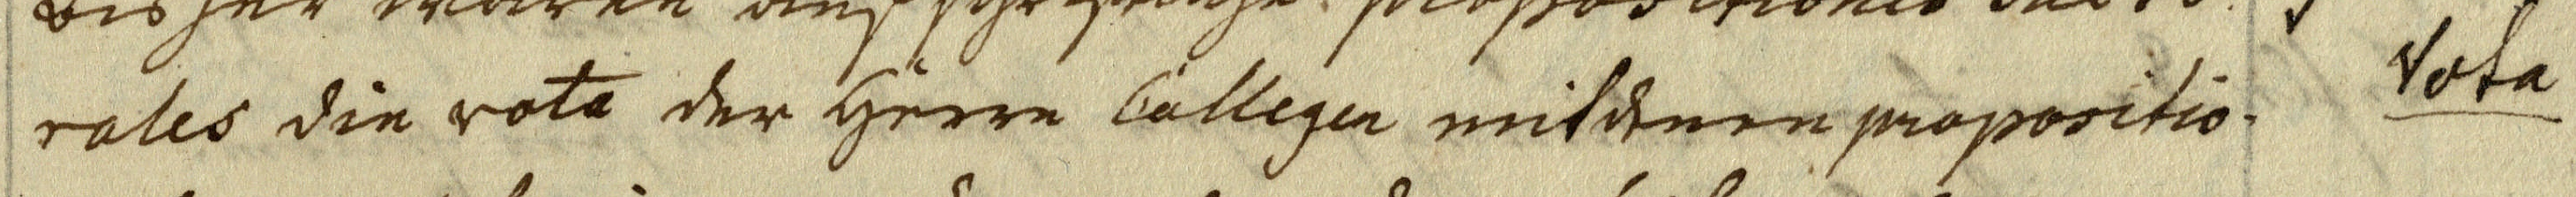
rales die vota der Herrn Collegen mit denen propositio¬
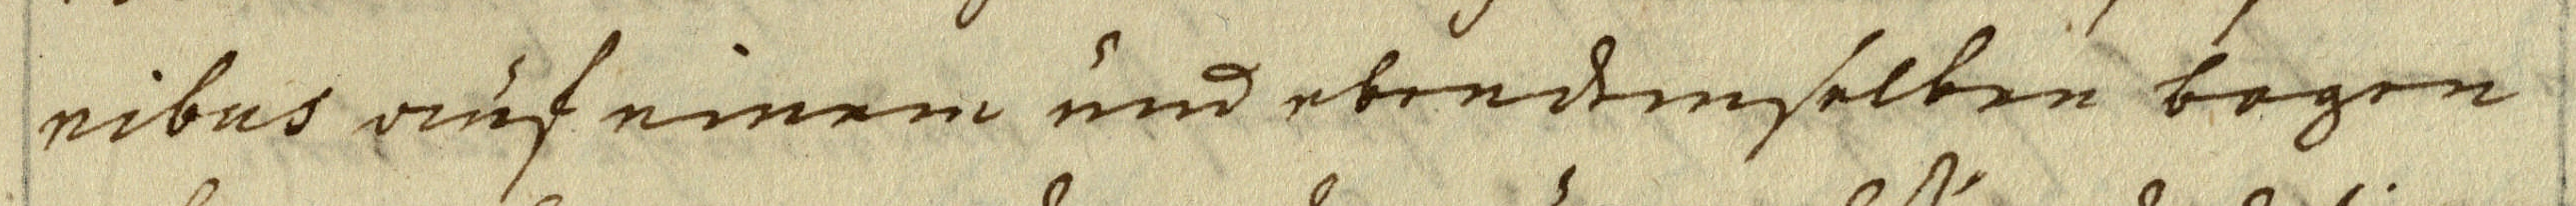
nibus auf einem und ebendemselben Bogen
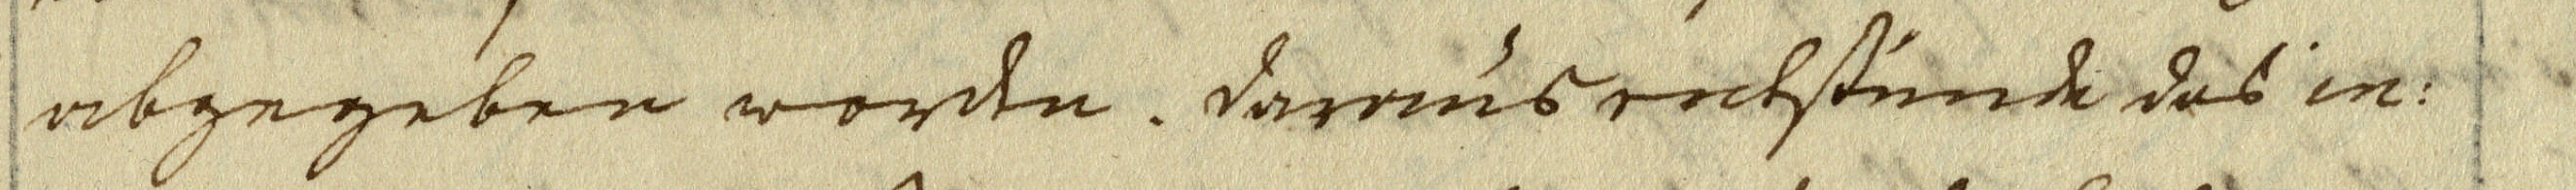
abgegeben worden. Daraus entstünde das in¬
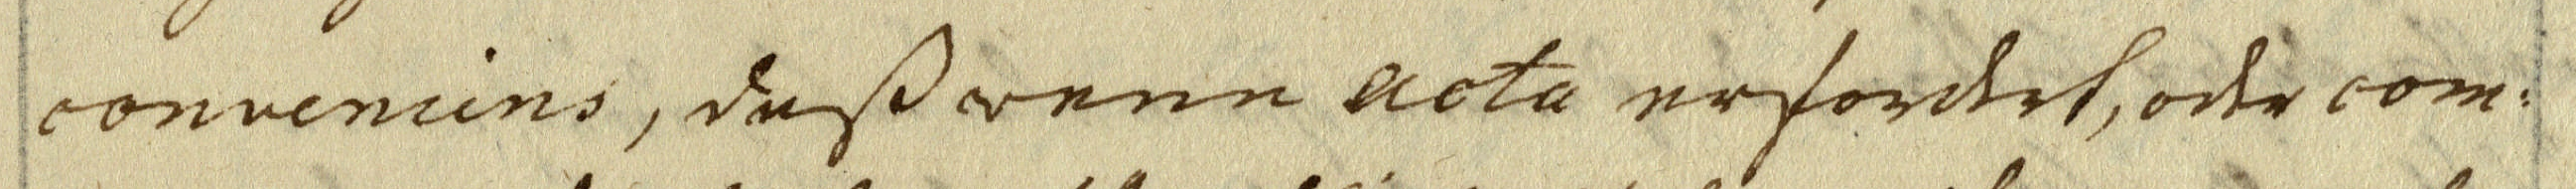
conveniens, daß wenn acta erfordert, oder com¬
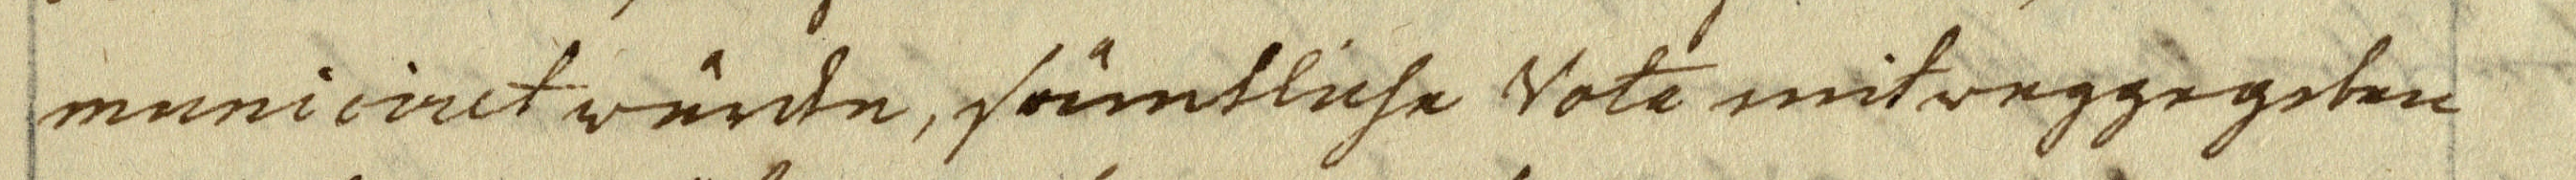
municiret würden, sämtliche Vota mit weggeben
